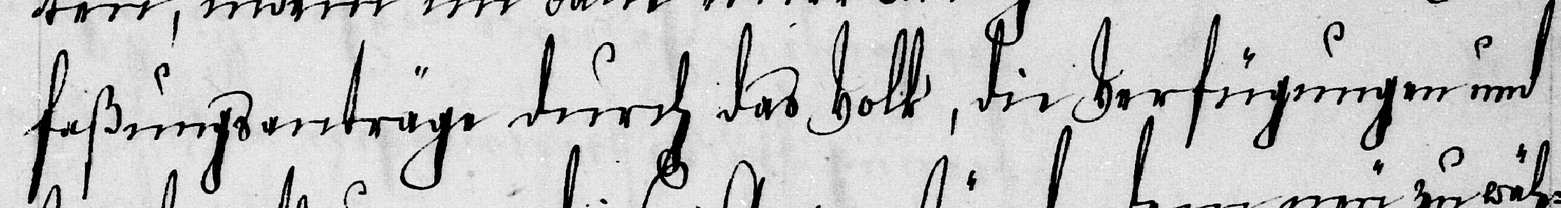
faßungsanträge durch das Volk, die Verfügungen und
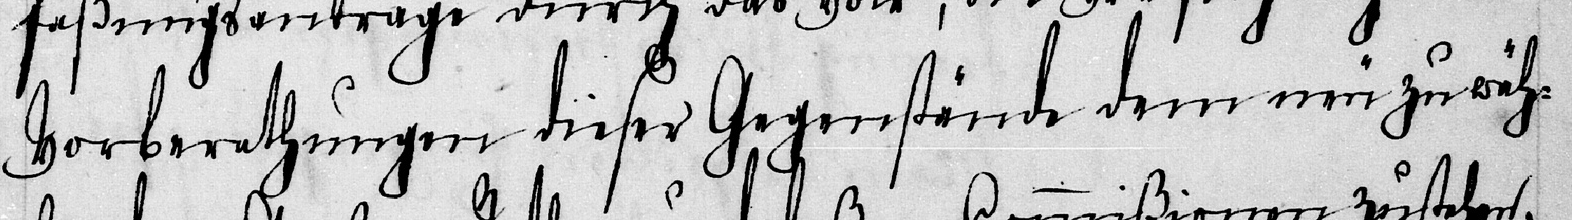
Vorberathungen dieser Gegenstände dem neu zu wäh¬
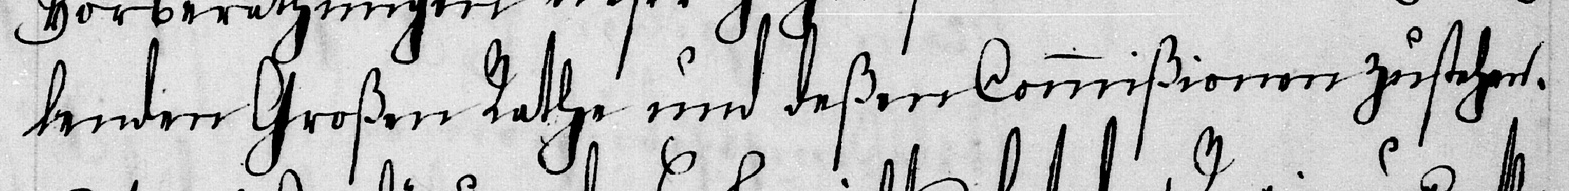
lenden Großen Rathe und deßen Commißionen zustehen.
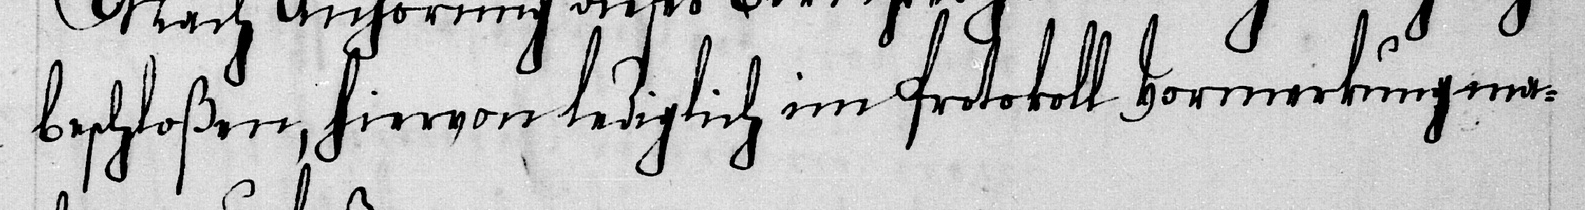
beschloßen, hiervon lediglich im Protokoll Vormerkung ma¬
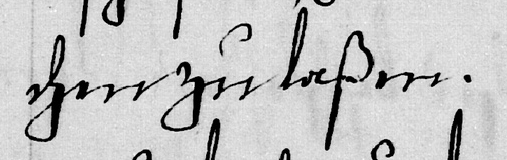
chen zu laßen.
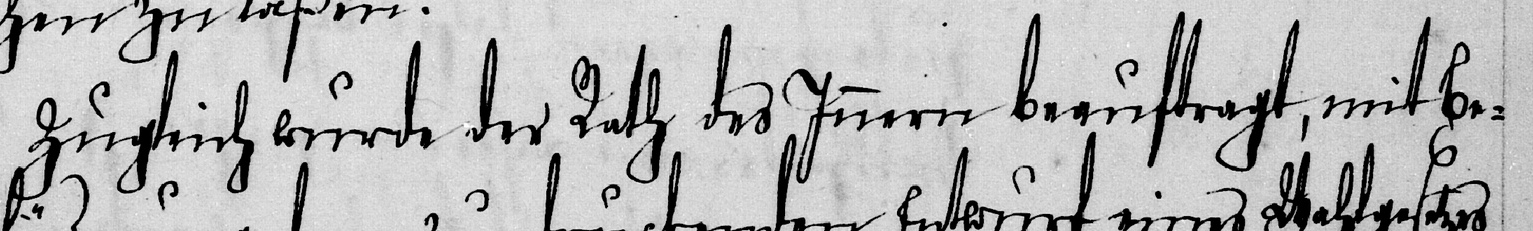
Zugleich wurde der Rath des Innern beauftragt, mit Be¬
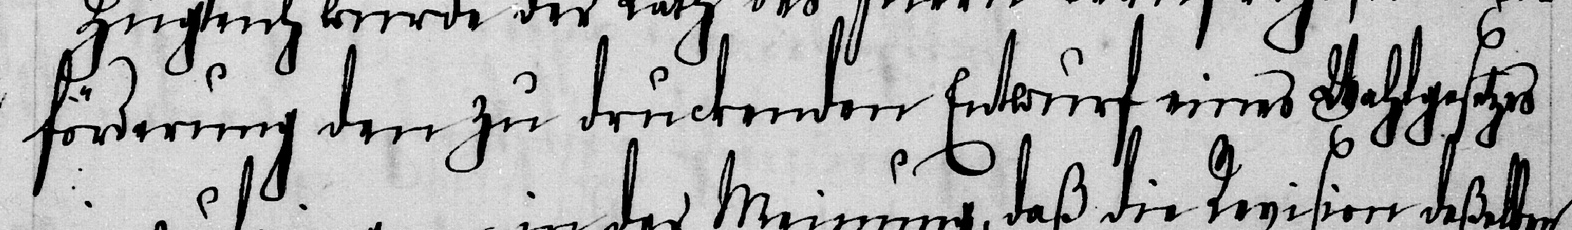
förderung den zu druckenden Entwurf eines Wahlgesetzes
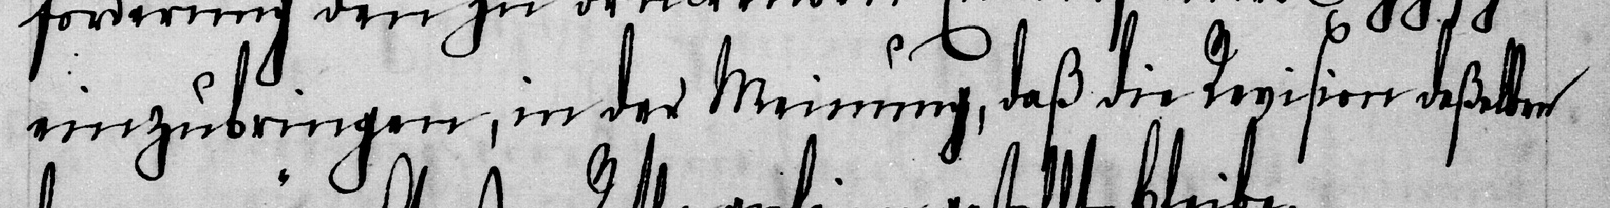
einzubringen, in der Meinung, daß die Revision deßelben
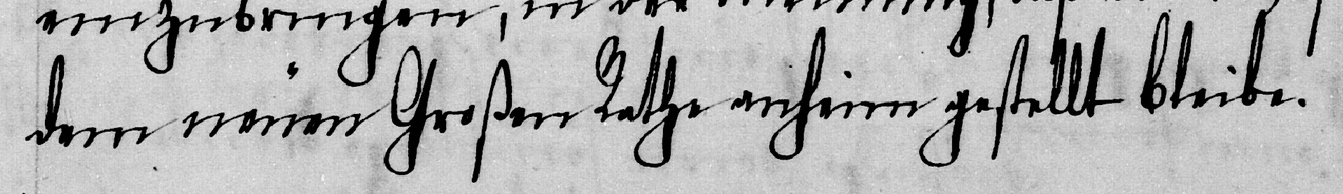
dem neuen Großen Rathe anheim gestellt bleibe.
